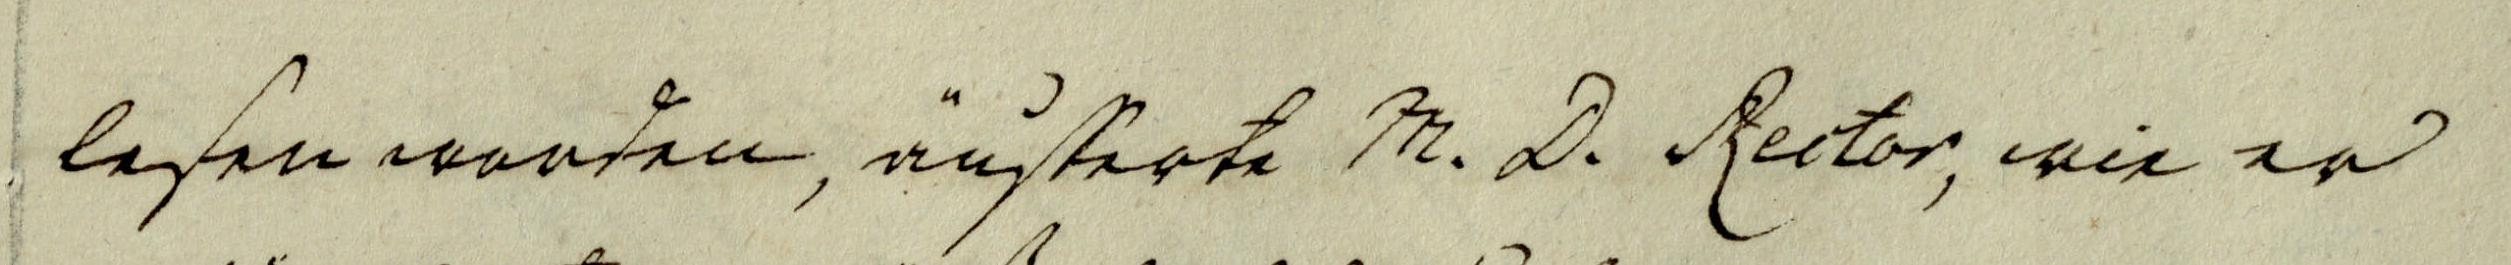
lesen worden, äusserte M. D. Rector, wie er
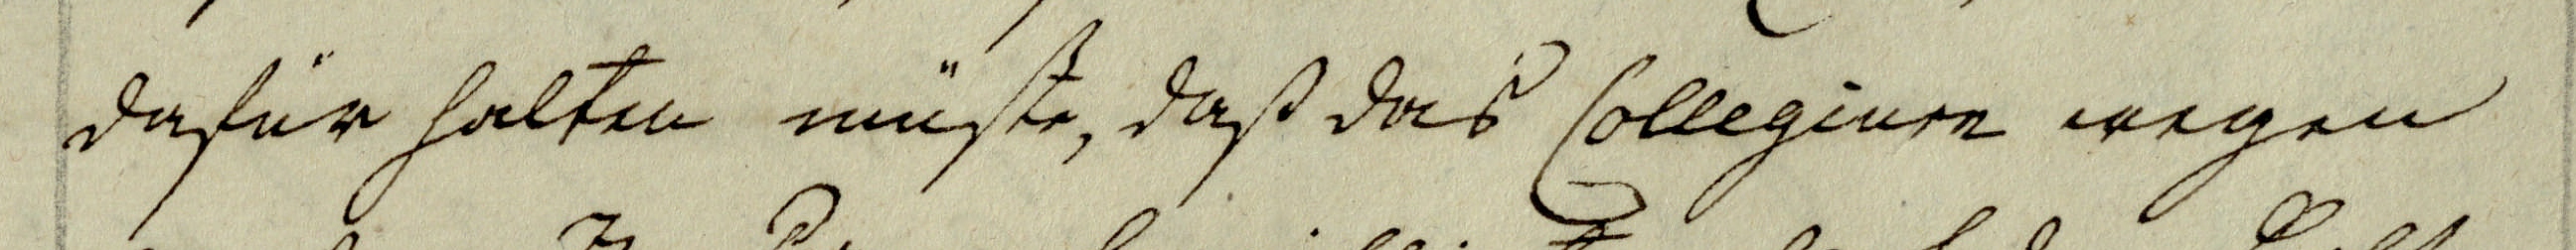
dafür halten müßte, daß das Collegium wegen
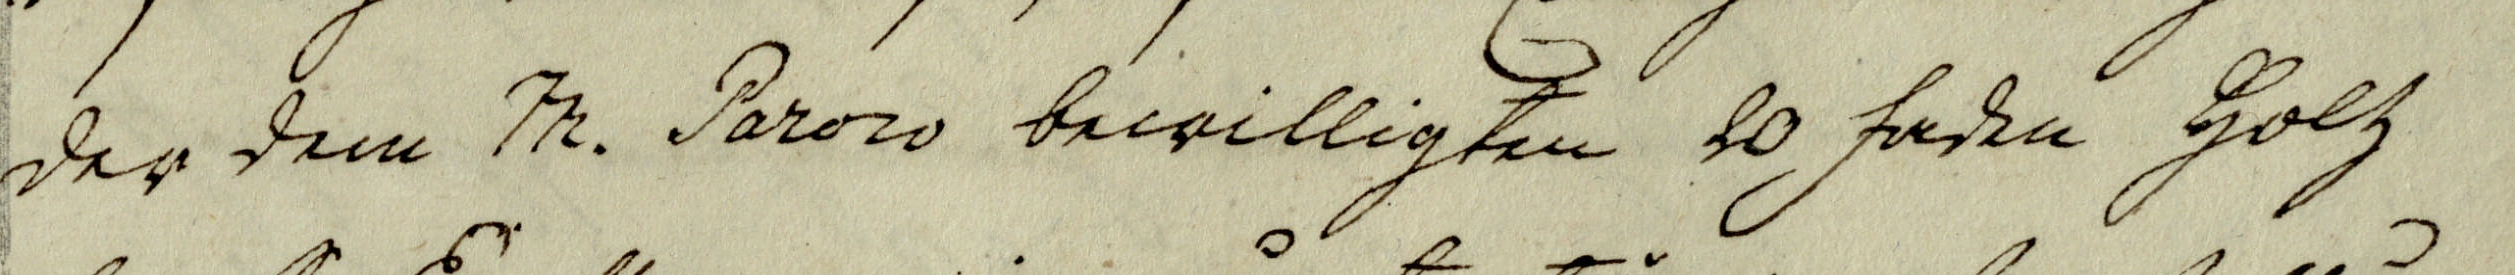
der dem M. Parow bewilligten 20 Faden Holz
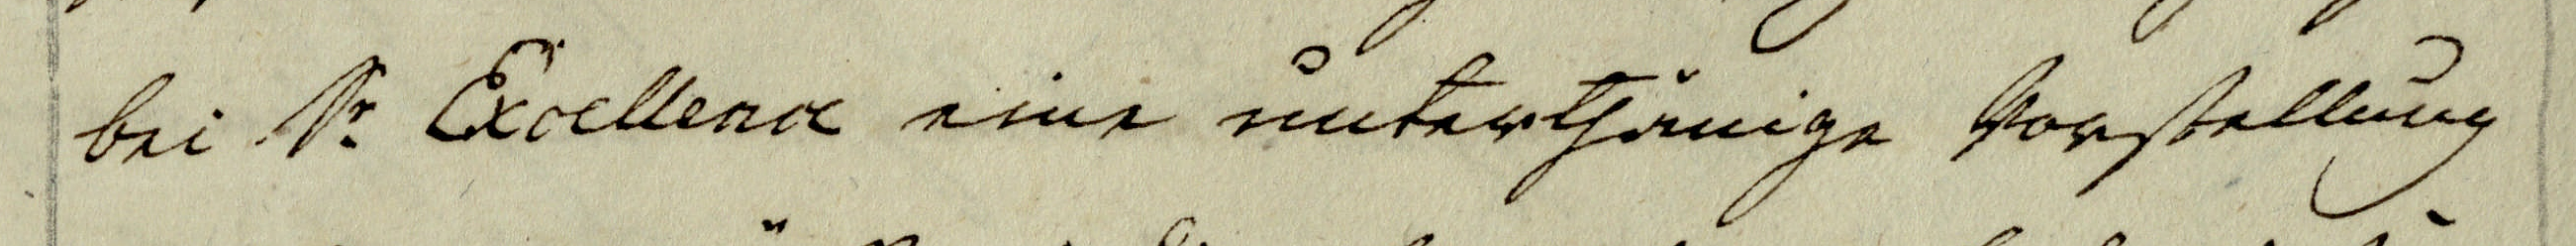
bei Sr Excellence eine unterthänige Vorstellung
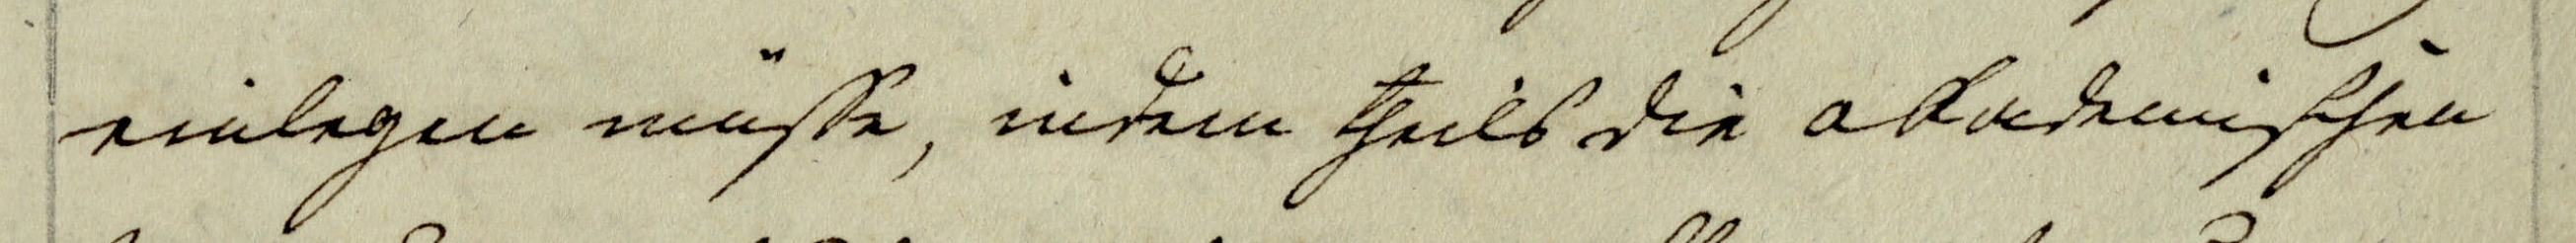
einlegen müsse, indem theils die akademischen
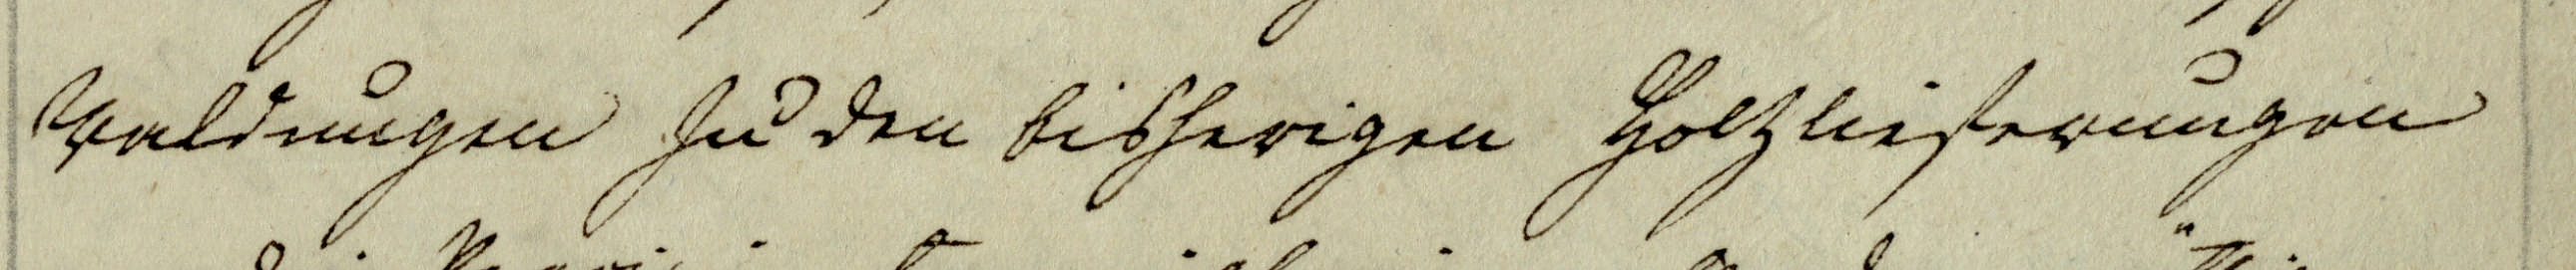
Waldungen zu den bisherigen Holzlieferungen
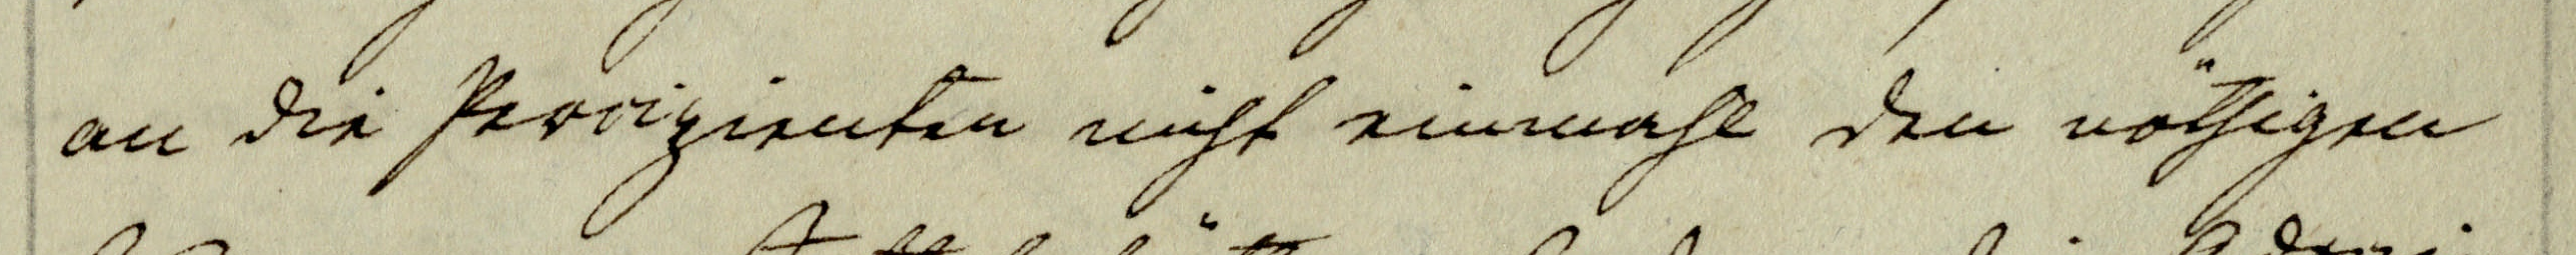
an die Percipienten nicht einmahl den nöthigen
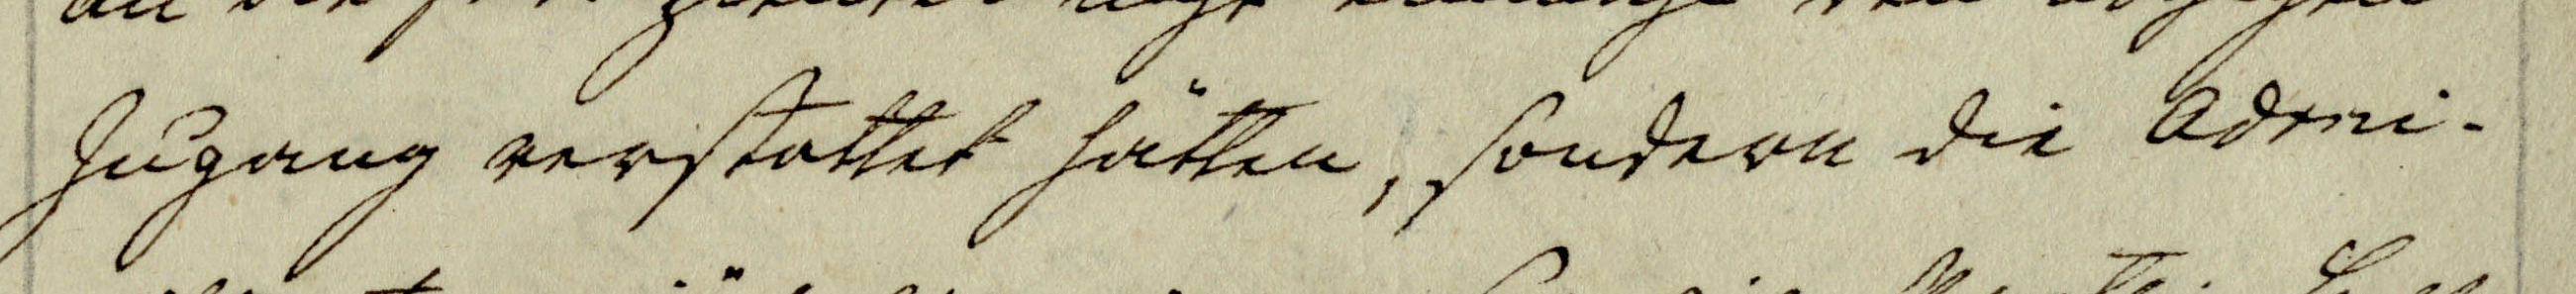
Zugang verstattet hätten, sondern die Admi¬
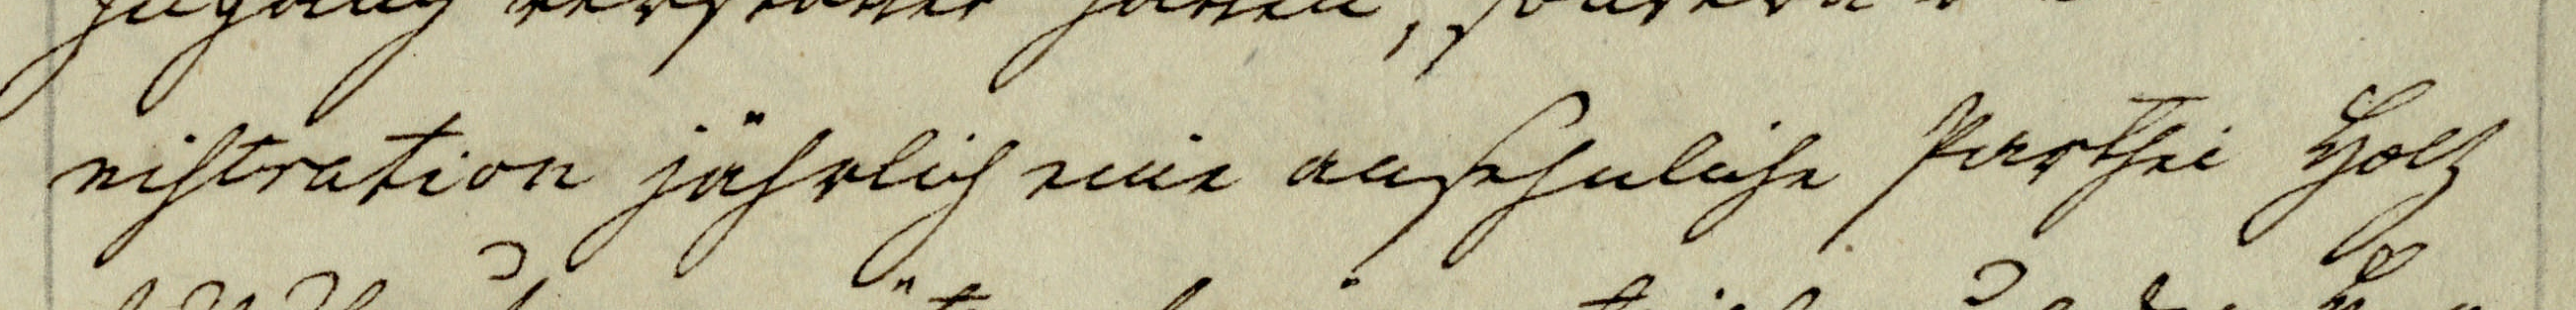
nistration jährlich eine ansehnliche Parthei Holz
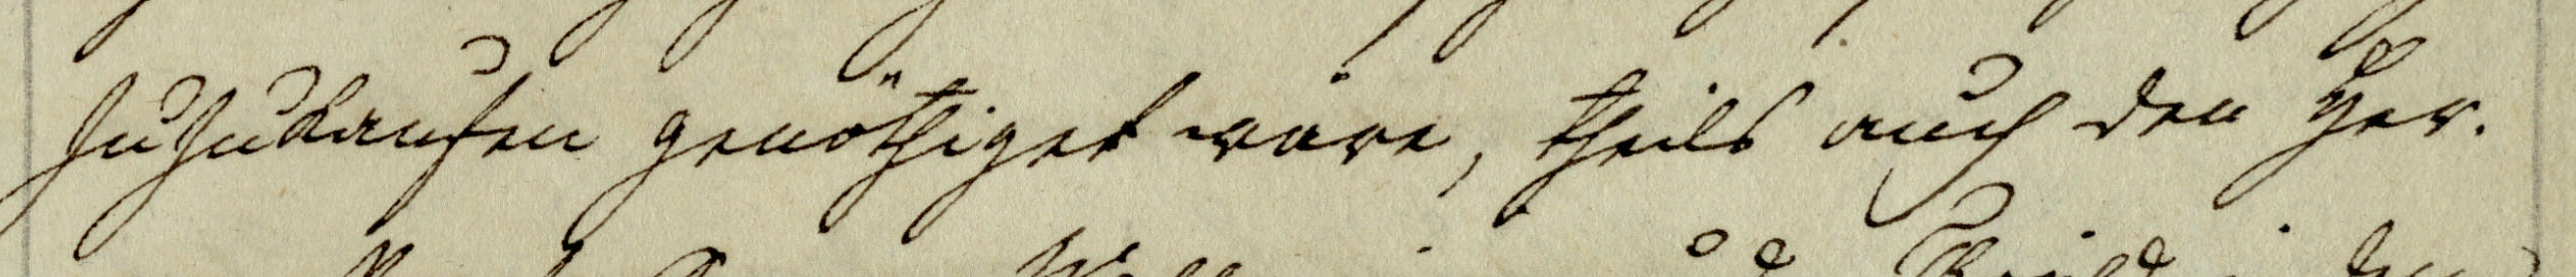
zuzukaufen genöthiget wäre, theils auch den Her¬
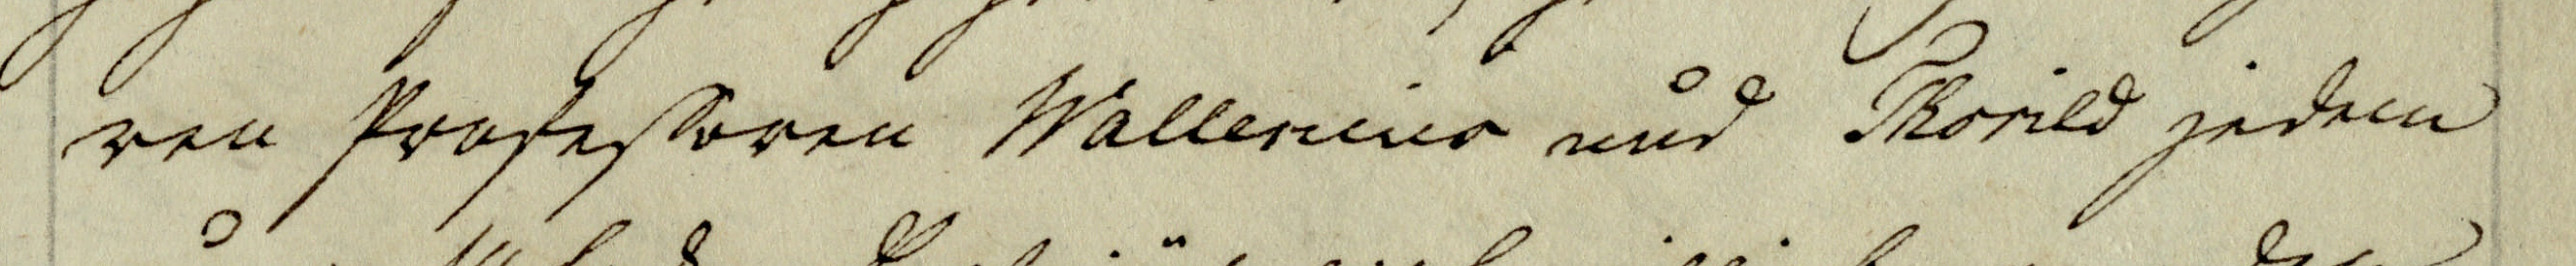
ren Professoren Wallenius und Thorild jedem
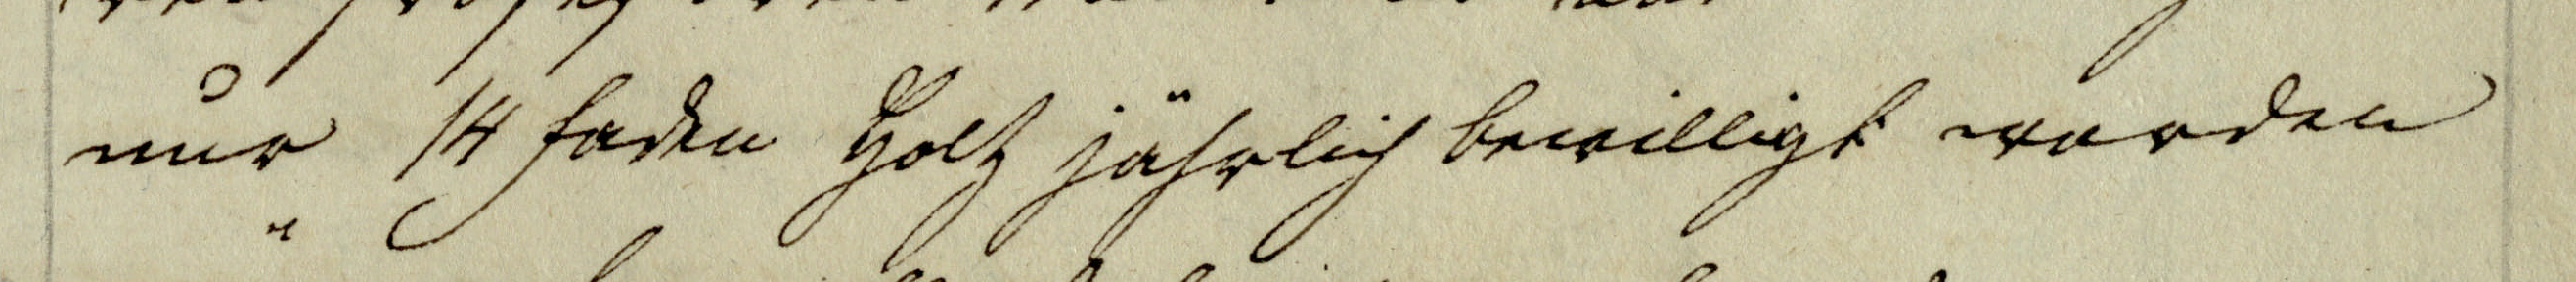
nur 14 Faden Holz jährlich bewilligt worden
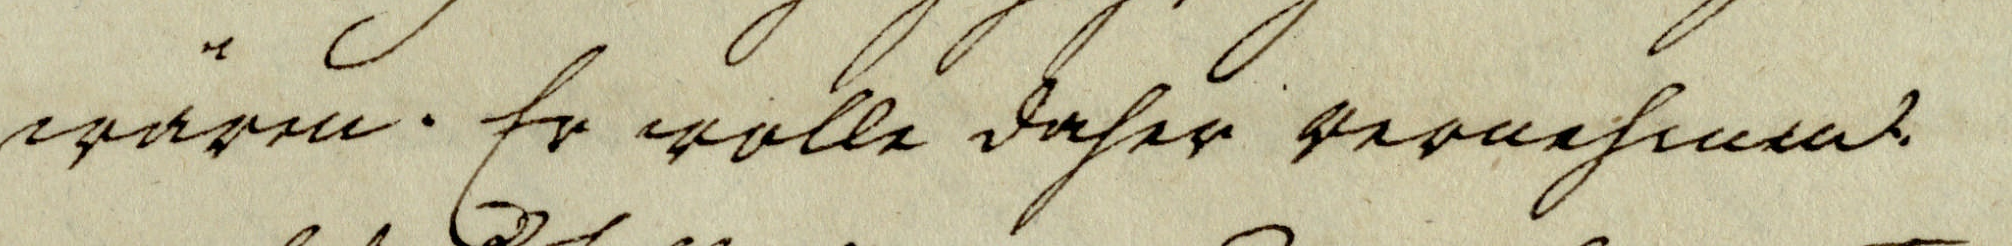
wären. Er wolle daher vernehmen:
